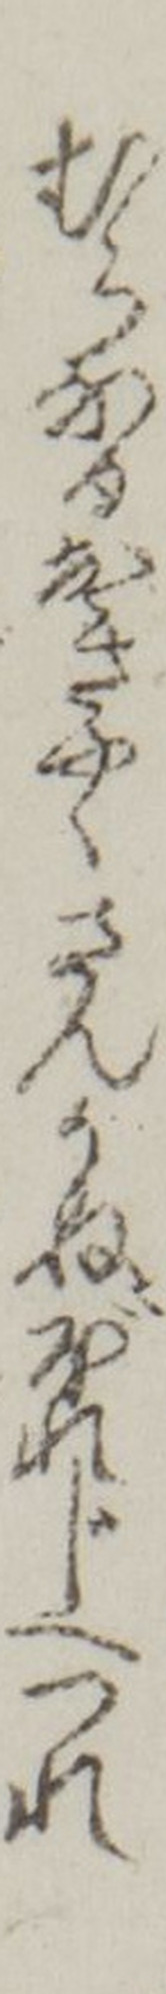むらなるおきやくさんうねぼれじへつれ
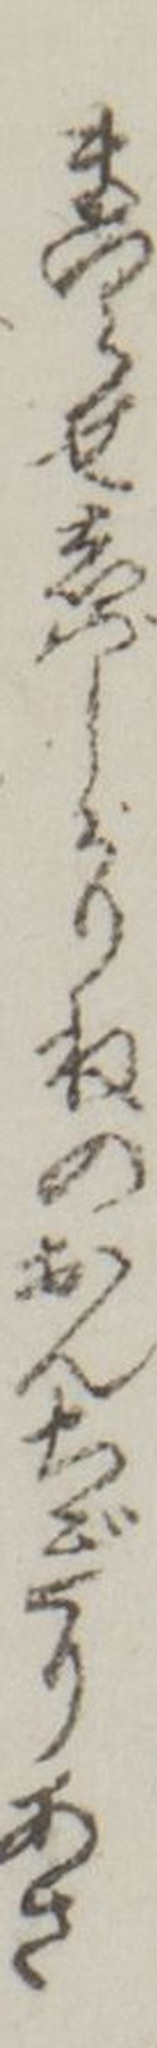まいらせしばしかりねのおんちぎりあさ
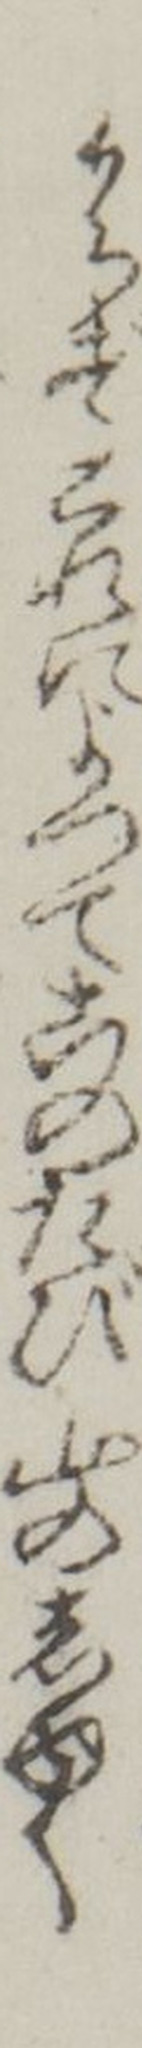からずこれによつてこのたび山のしゆく
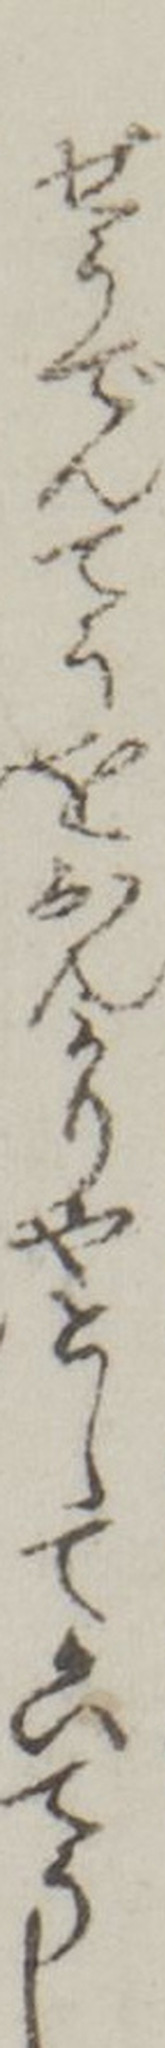せうでんてうをおんかりやとしてかいてうし
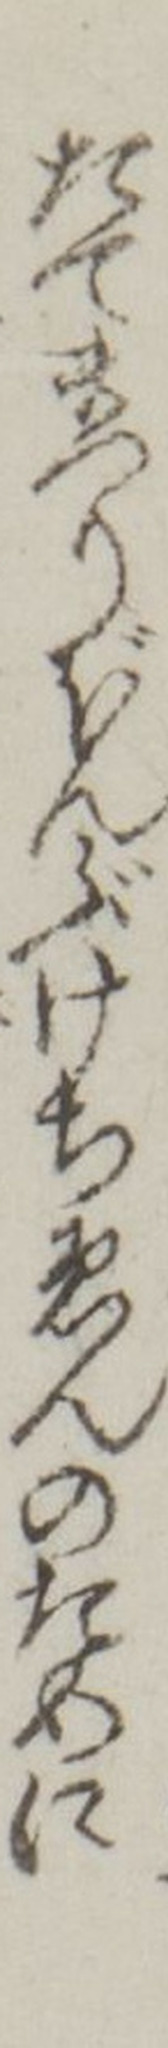たてまつりぼんぶけちゑんのために
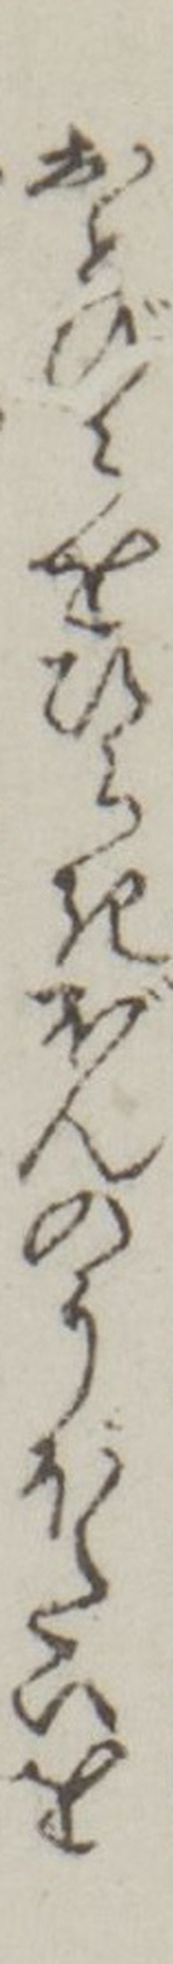おとびらをひらきぼんのうほたいを
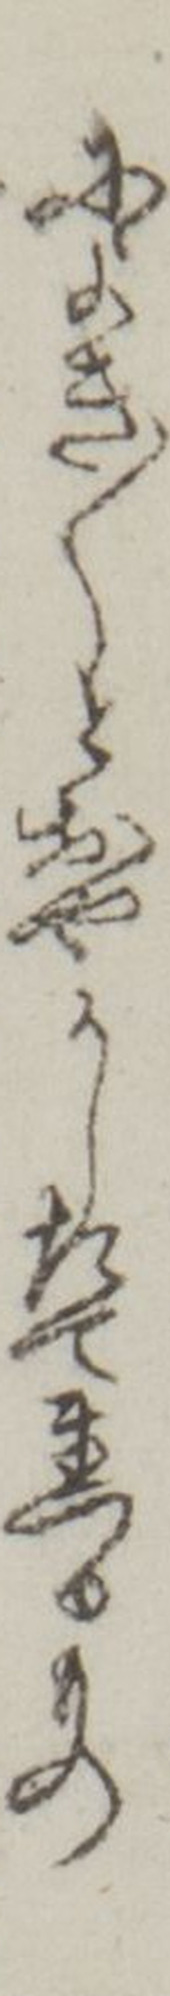によき〳〵とおやかしたてまつるもの
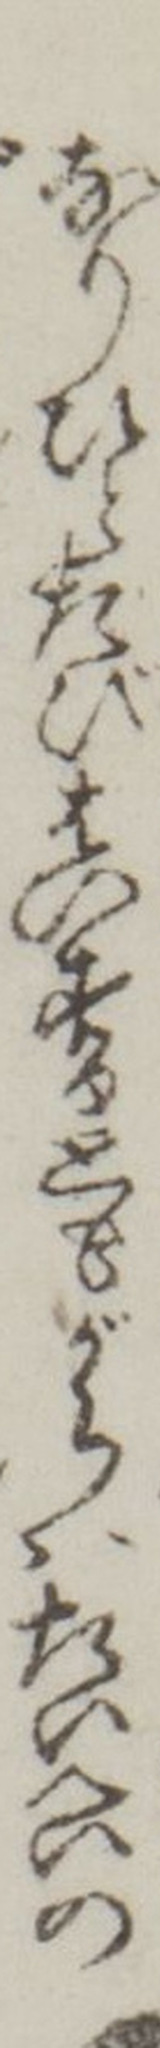なりひとたびはいするともがらはたいへいの
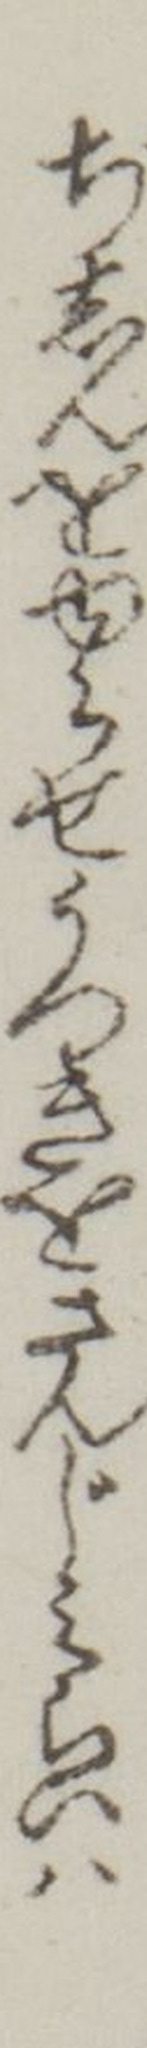ぢしんをゆらせうつきをさんじみらいは
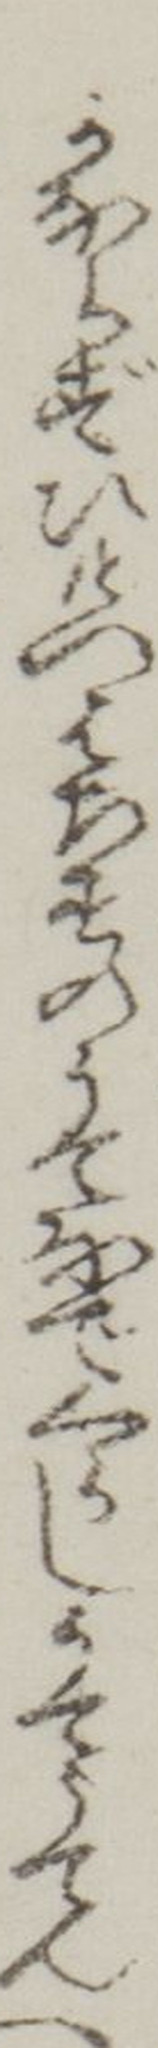かならずひとつはちすのうてなでくらしうてうてんへ
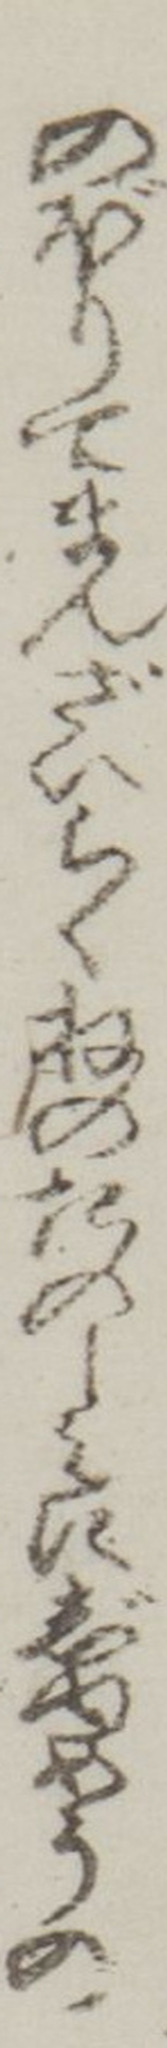のぼりてまんざいらくねのたのしみにじゆめうの
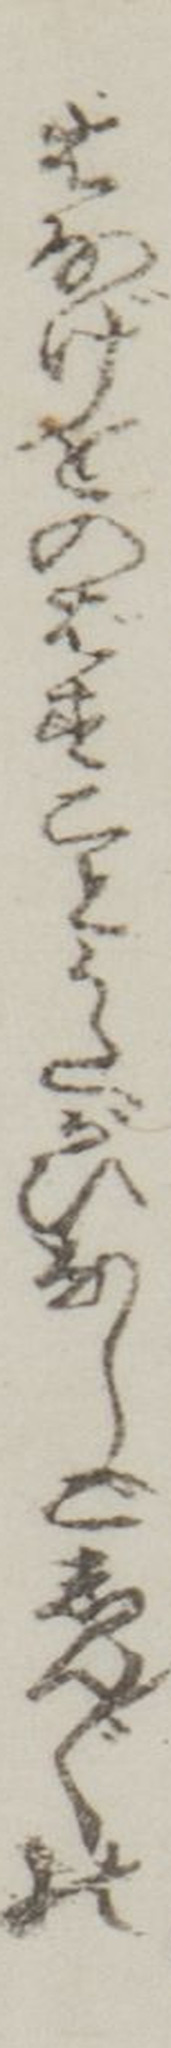はなげをのばすことうたがひなしごしん〴〵の
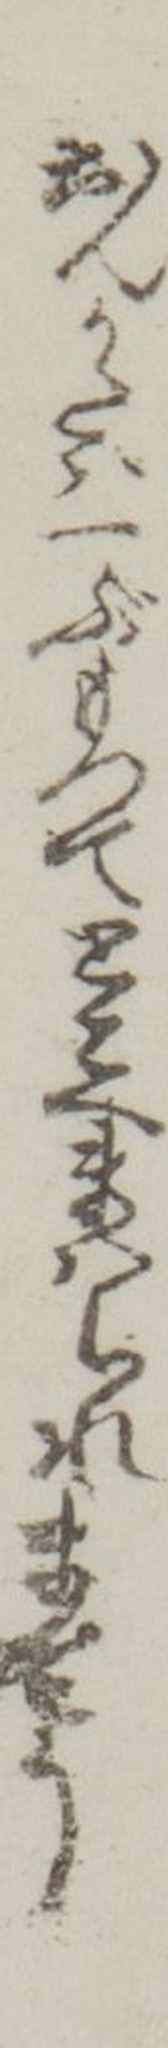おんかたは一ぶもつてとこへまはられませう
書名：泪如来の損像
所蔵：あいおいニッセイ同和損保株式会社
